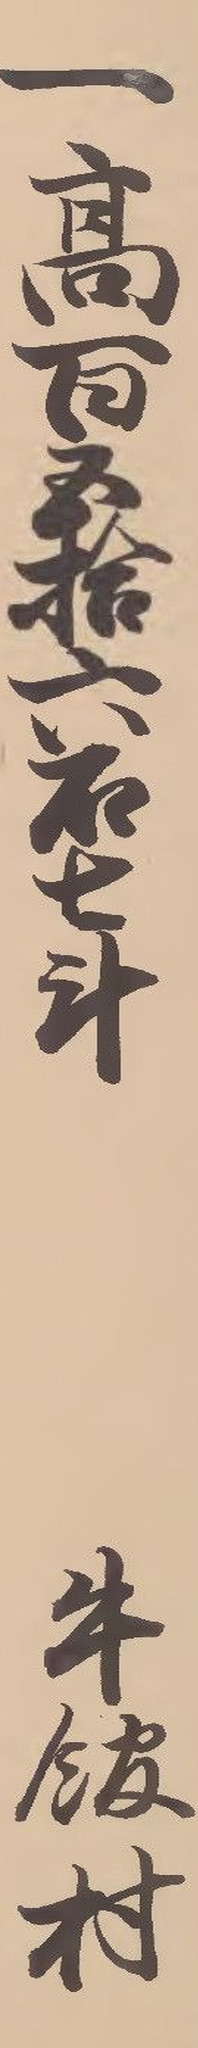一高百五拾六石七斗牛館村
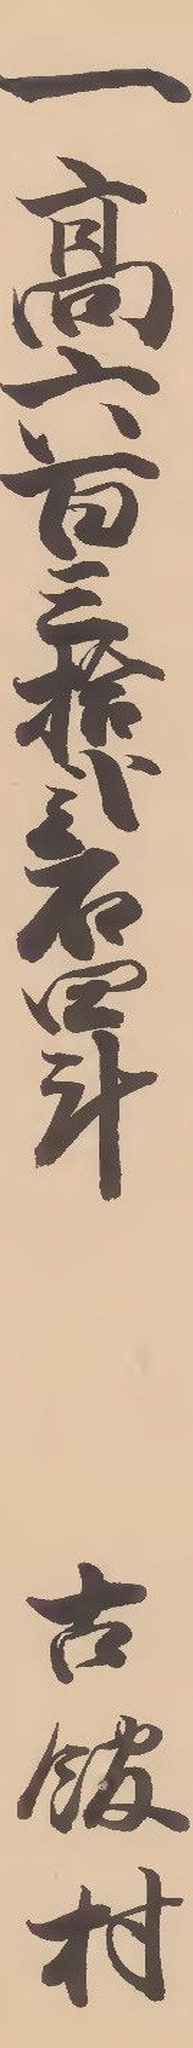一高六百三拾弐石四斗古館村
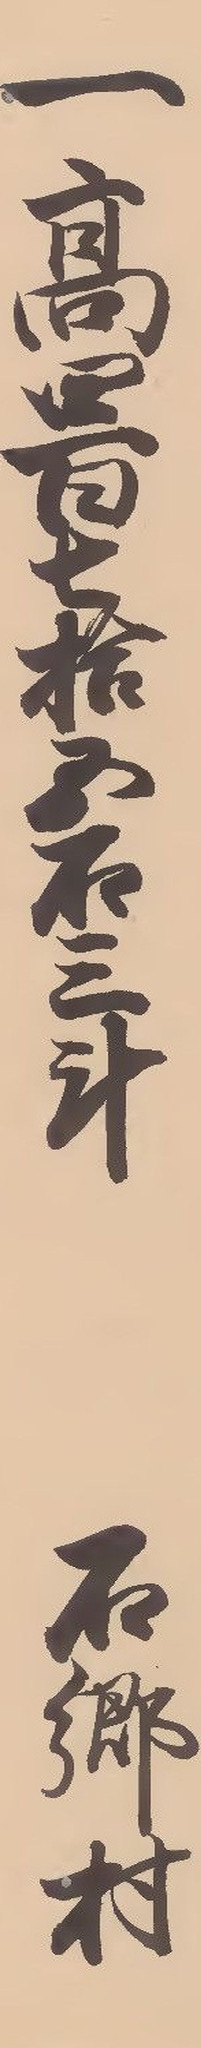一高四百七拾五石三斗石郷村

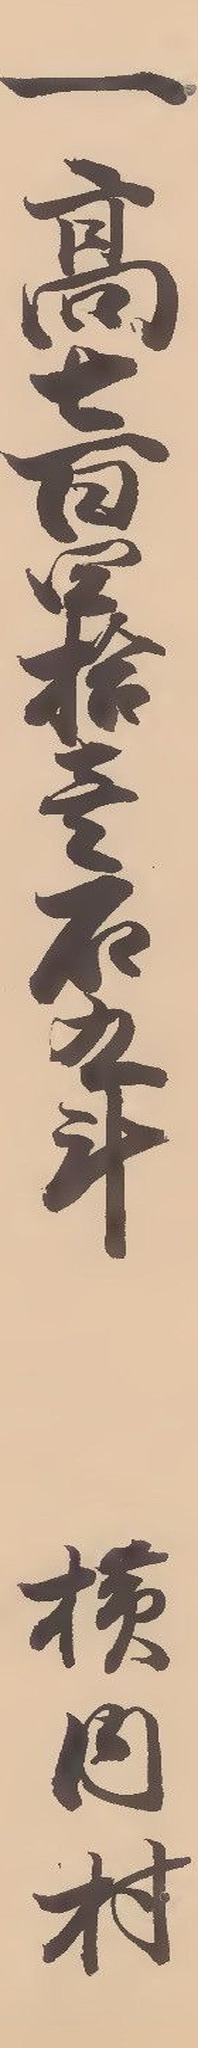一高七百四拾壱石九斗横内村
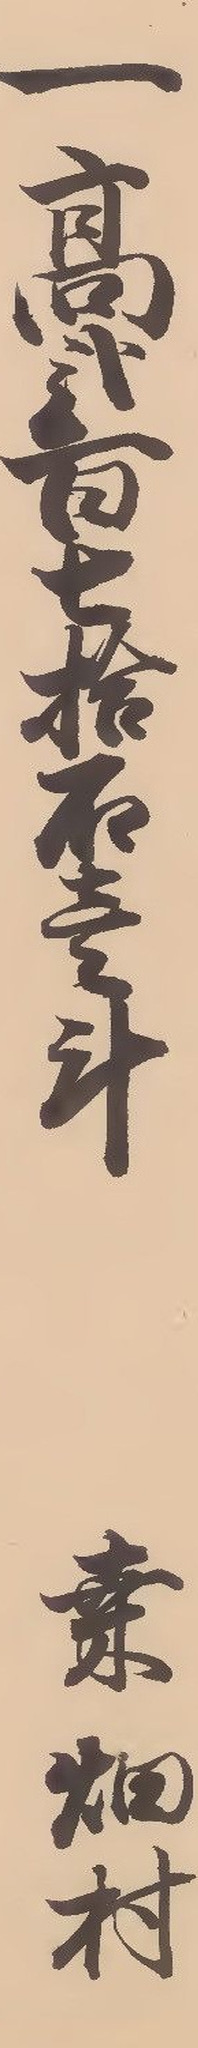一高弐百七拾石壱斗桑畑村
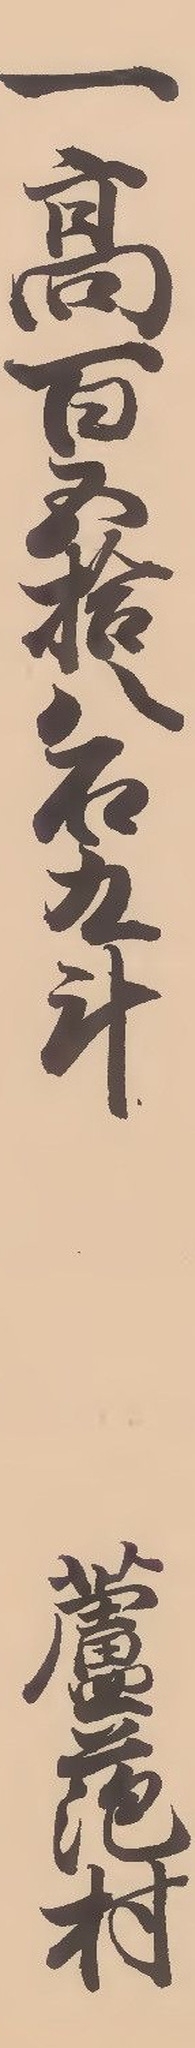一高百五拾八石九斗芦萢村
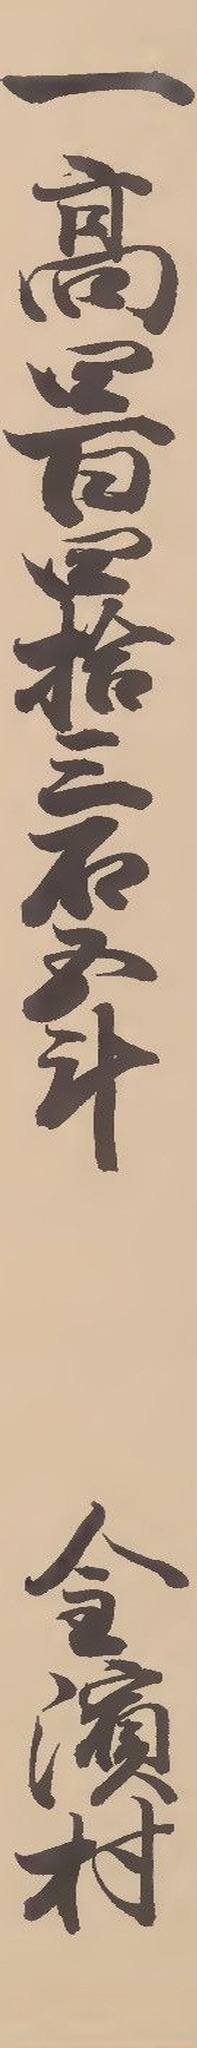一高四百四拾三石五斗金浜村
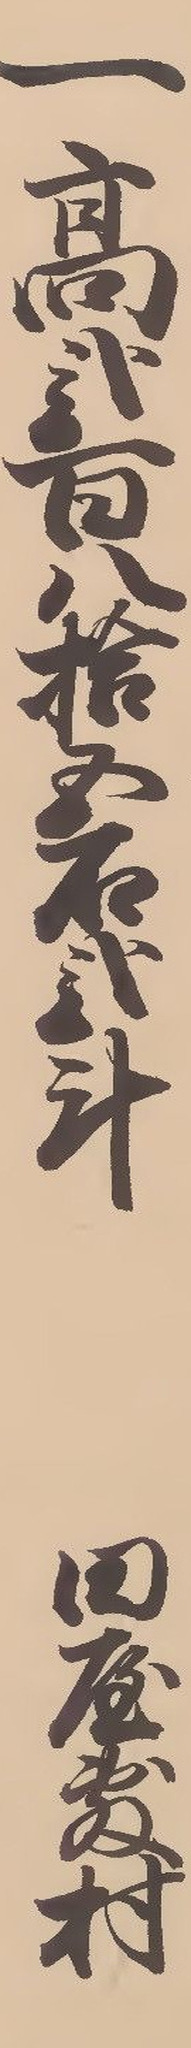一高弐百八拾五石弐斗田屋敷村
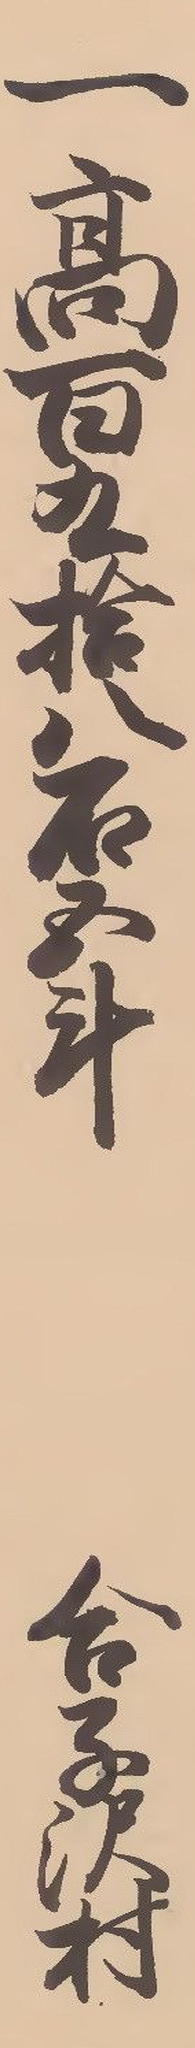一高百九拾八石五斗合子沢村
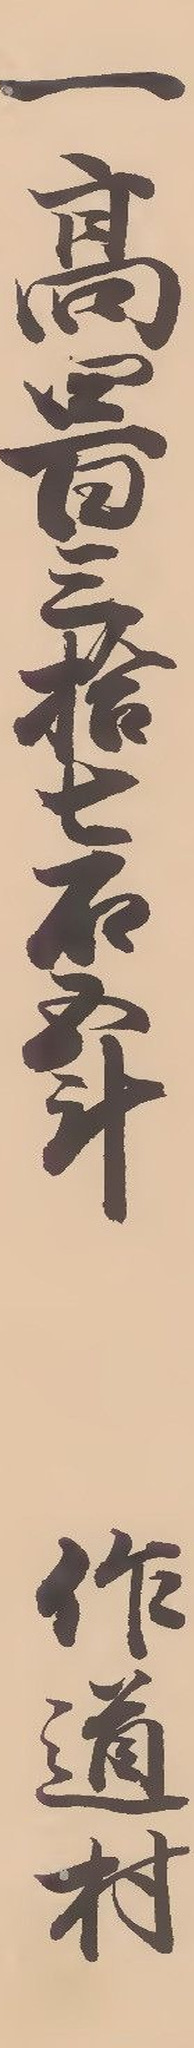一高四百三拾七石五斗作道村

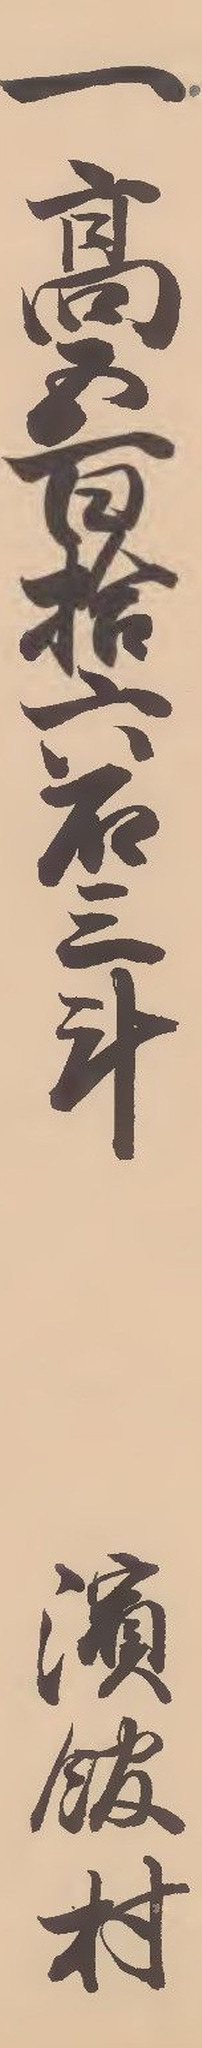一高五百拾六石三斗浜館村
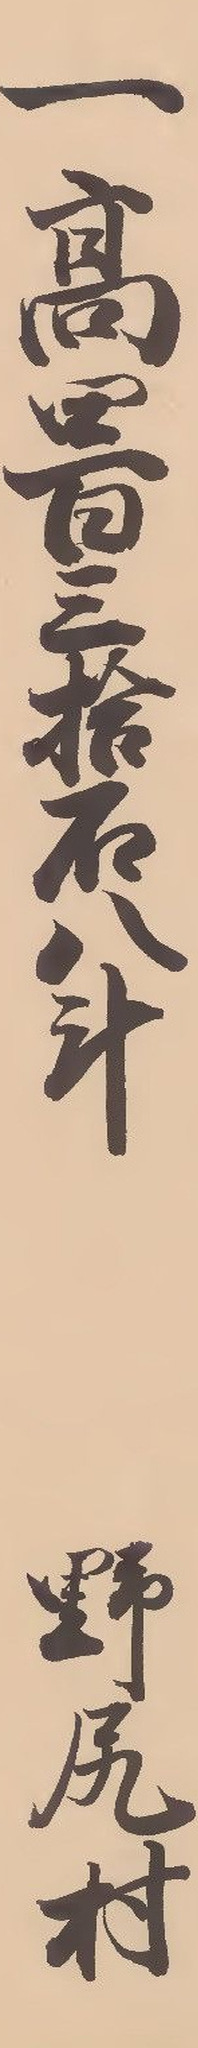一高四百三拾石八斗野尻村
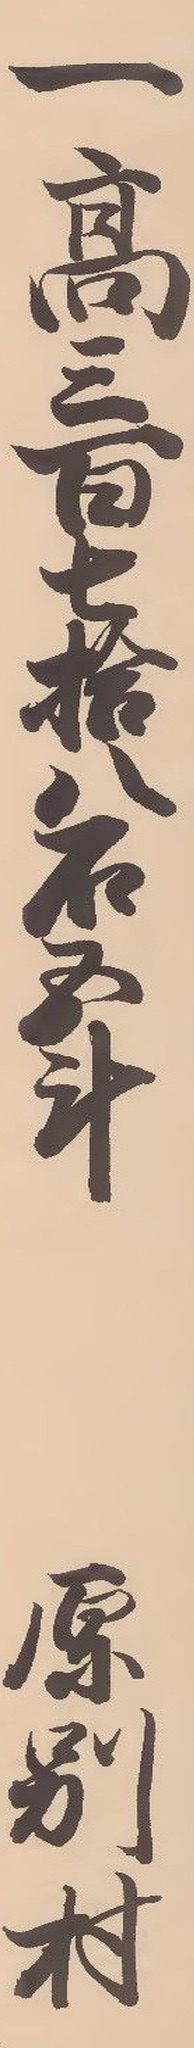一高三百七拾八石五斗原別村
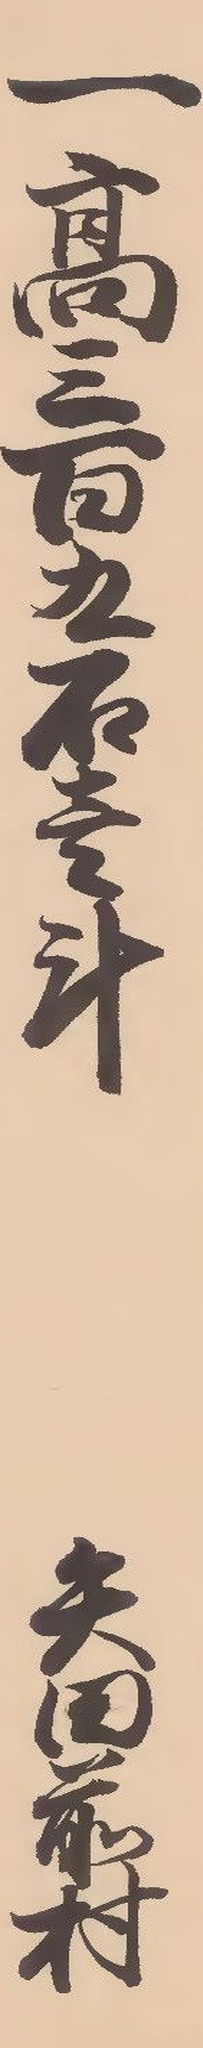一高三百九石壱斗矢田前村
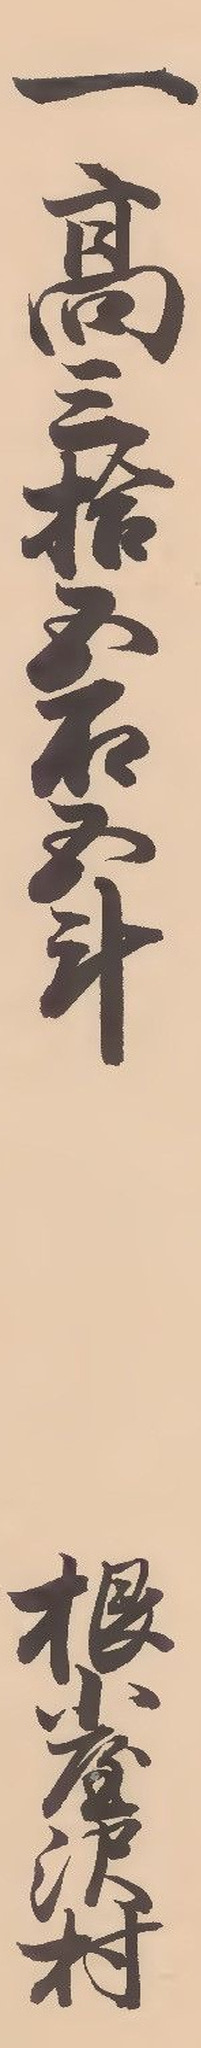一高三拾五石五斗根小屋沢村

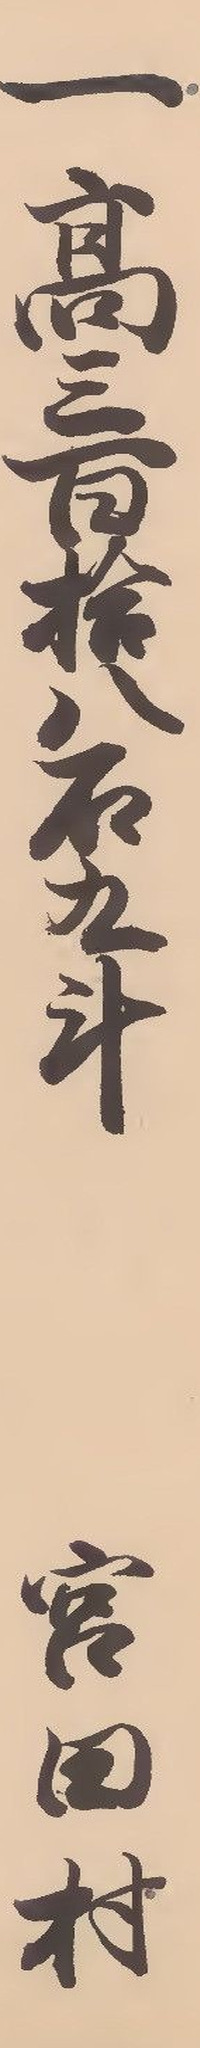一高三百拾八石九斗宮田村
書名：陸奥国郷帳　７
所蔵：国立公文書館 National Archives of Japan
